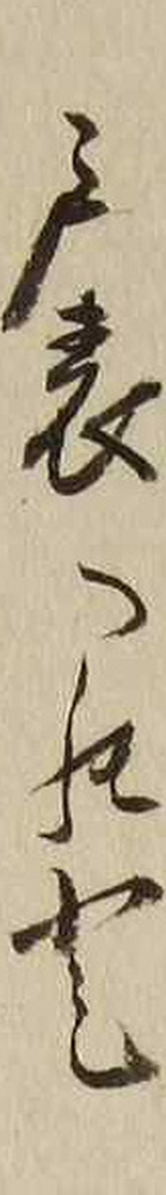戸表へ罷登
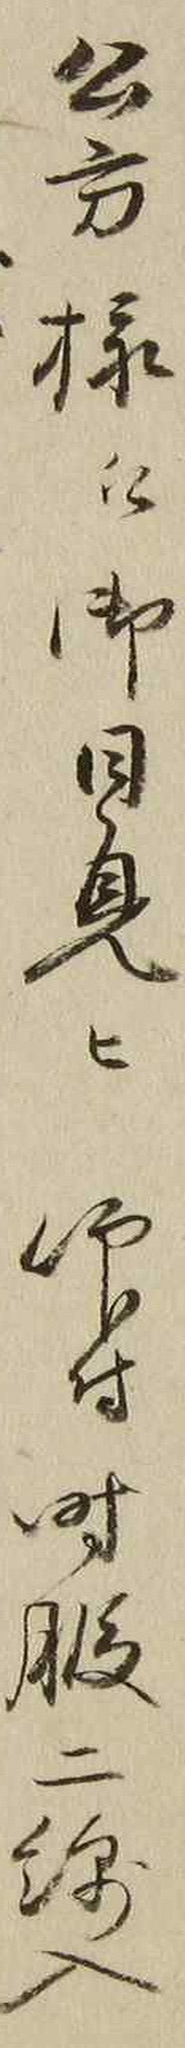公方様江御目見被仰付時服二綿入
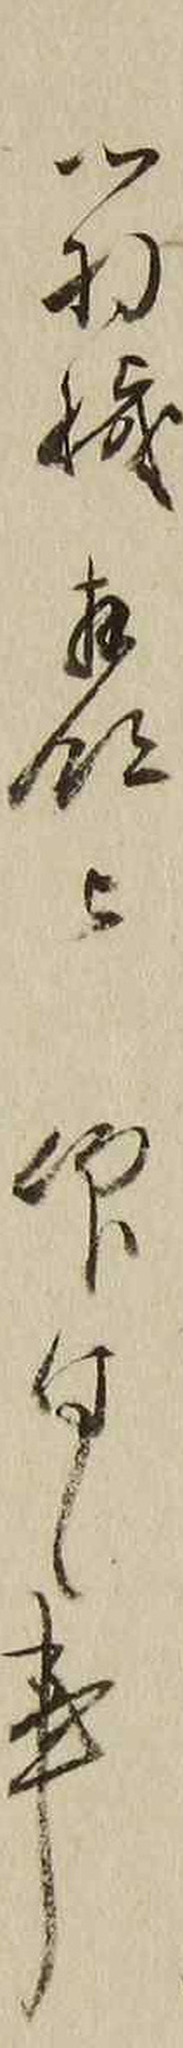御羽織拝領被仰付候事
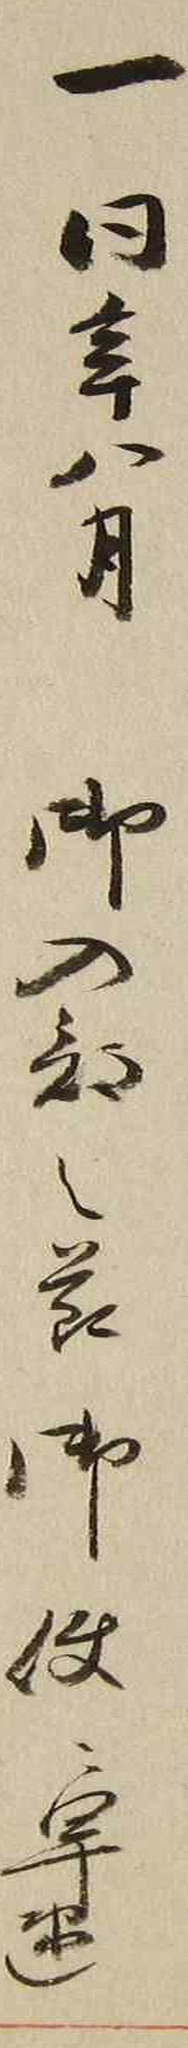一同年八月御入部之節御使に早速
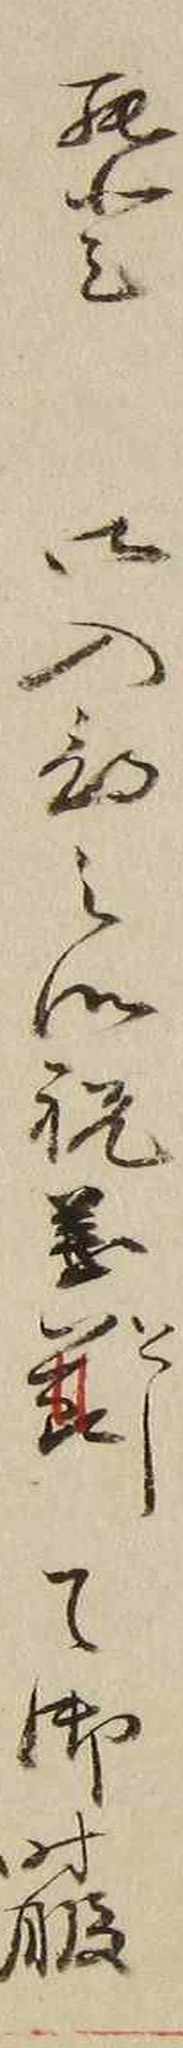罷登御入部之御祝義として御時服
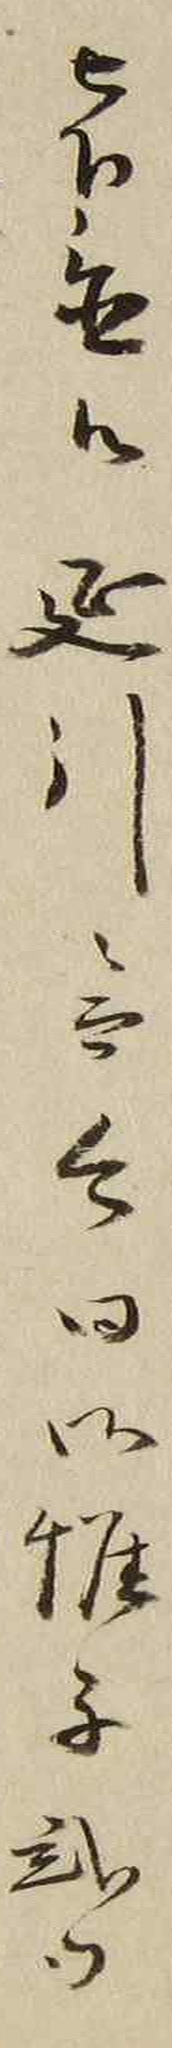被下置候延引に而今日御帷子弐つ
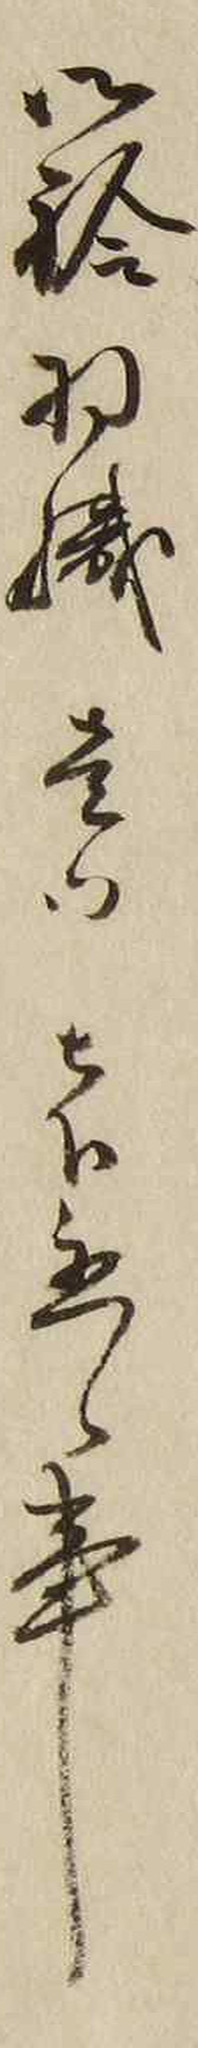御袷羽織壱つ被下置候事
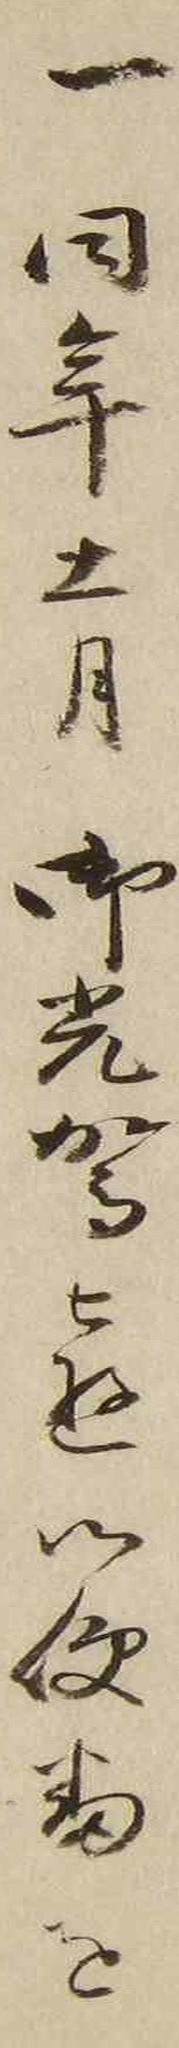一同年十一月御光駕被遊御使番を

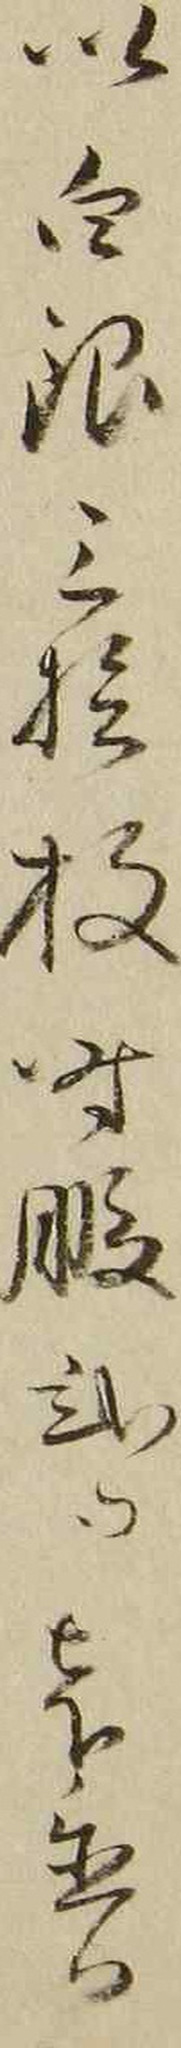以白銀三拾枚時服弐つ被下置候
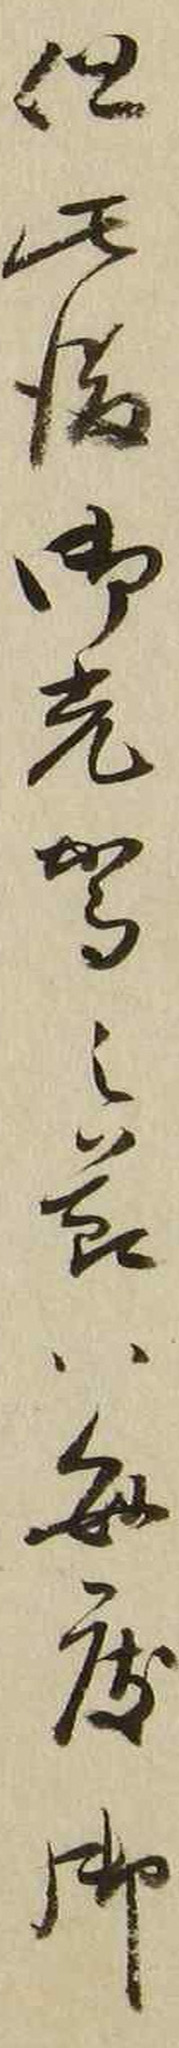但此已後御光駕之節は毎度御
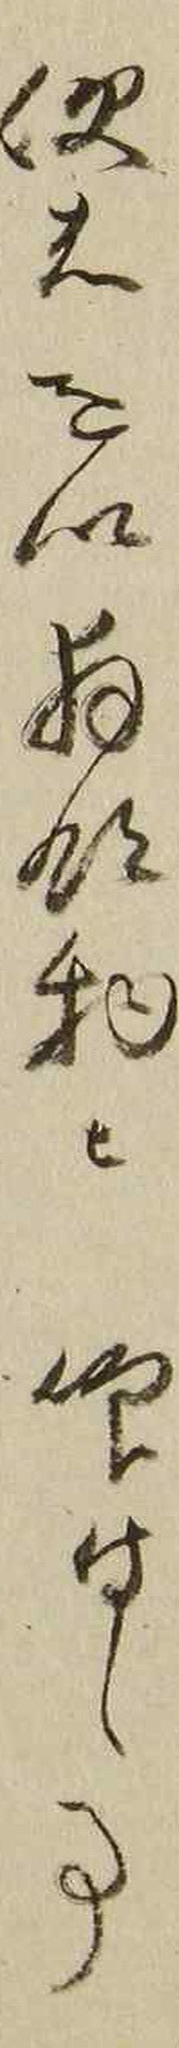使者を以拝領物被仰付候事
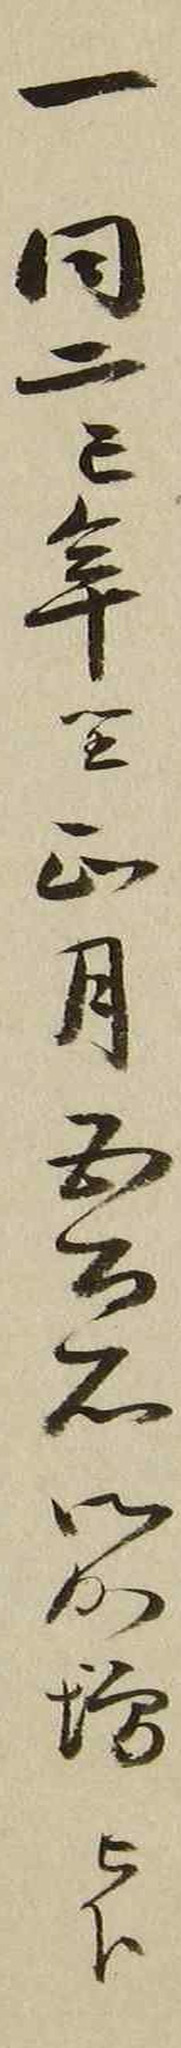一同二巳年閏正月五百石御加増被下
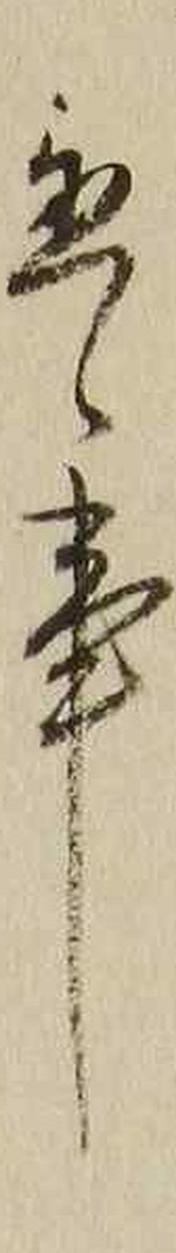置候事
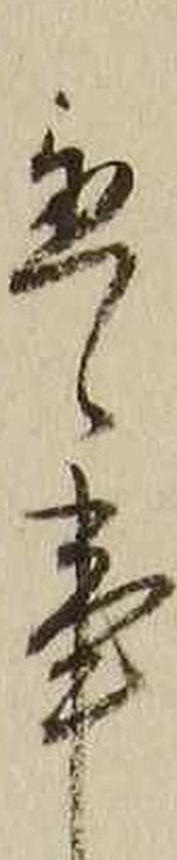置候事
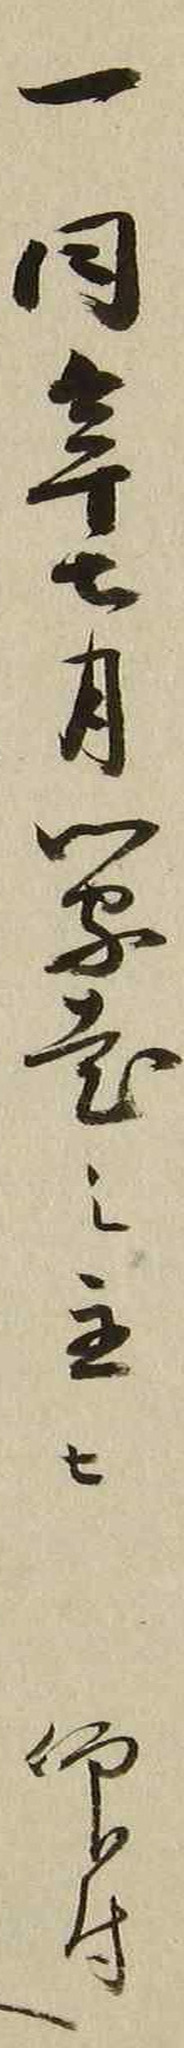一同年七月御家老之主被仰付
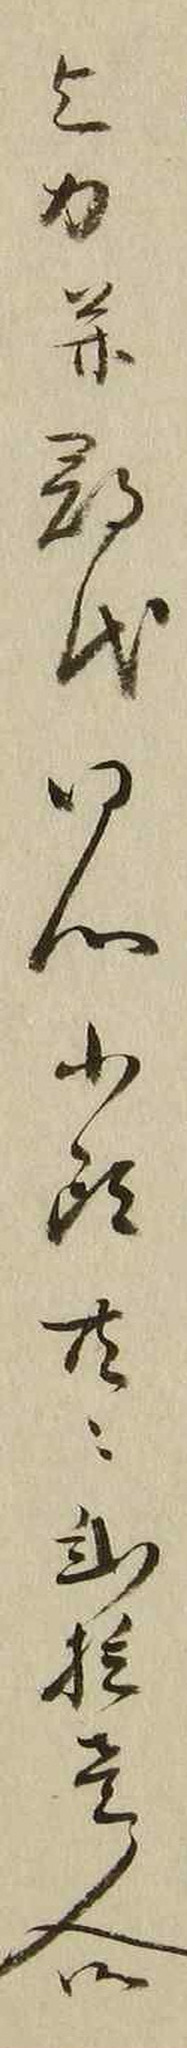与力并郡代同心小頭共に弐拾壱人御
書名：諸士系譜　巻之269　さ之部1
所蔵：会津若松市立会津図書館
